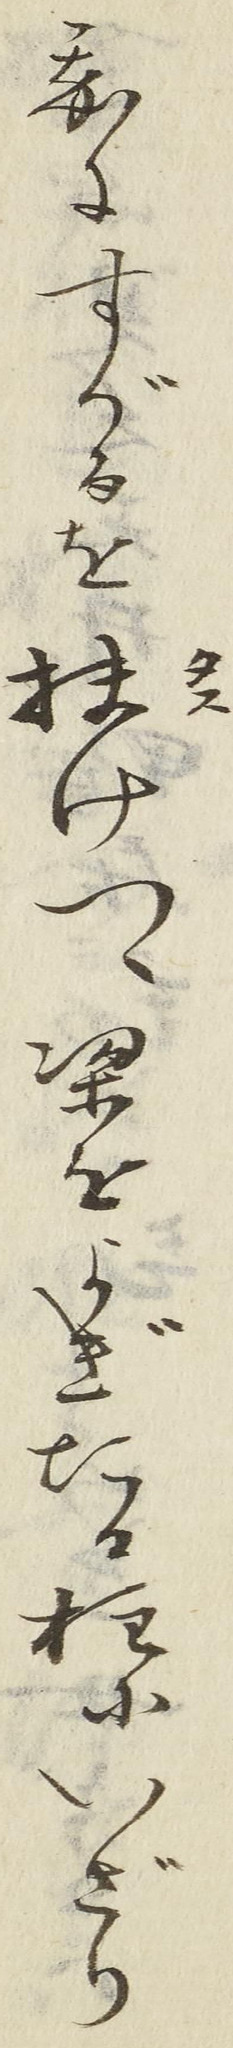我にすがるを扶けつゝ梁をよぎたる柱にいざり
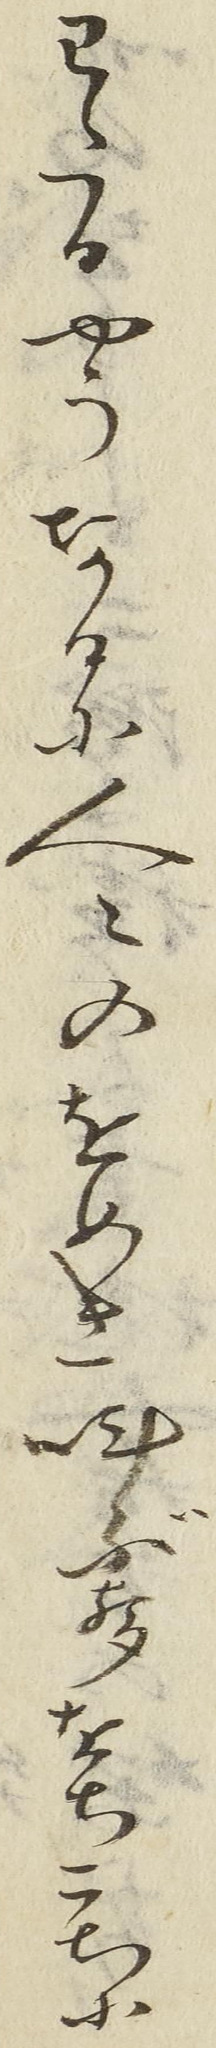わたるやうなるに人〻のをめき叫ぶ声をちこちに

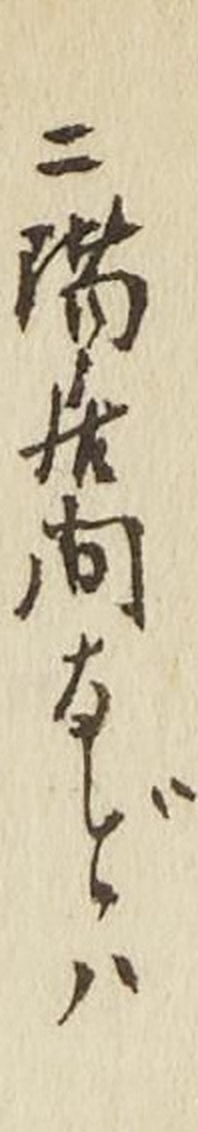二階居間などは
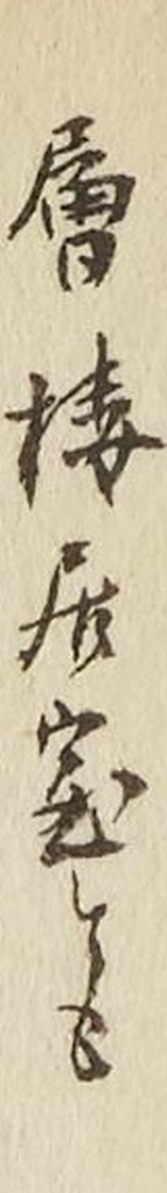層楼居室とも
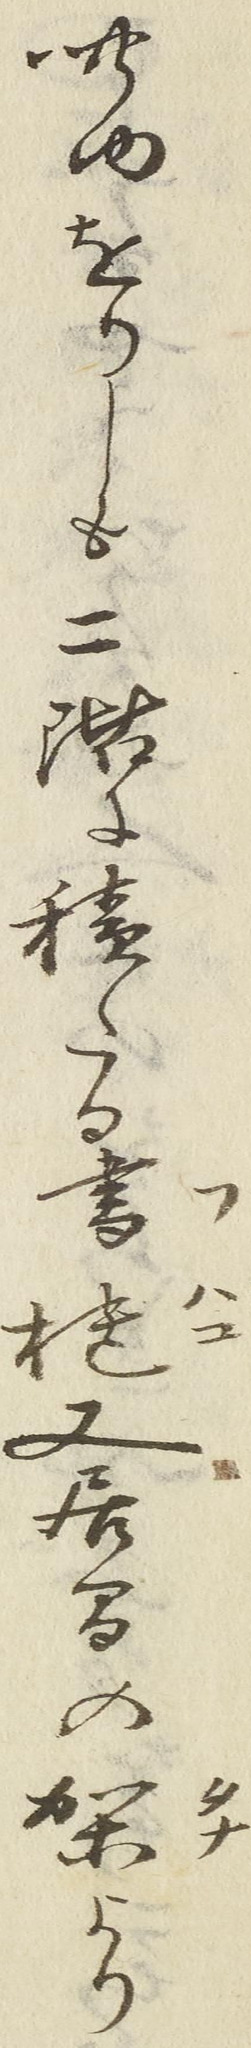聞ゆをりしも二階に積たる書櫃又居間の架より
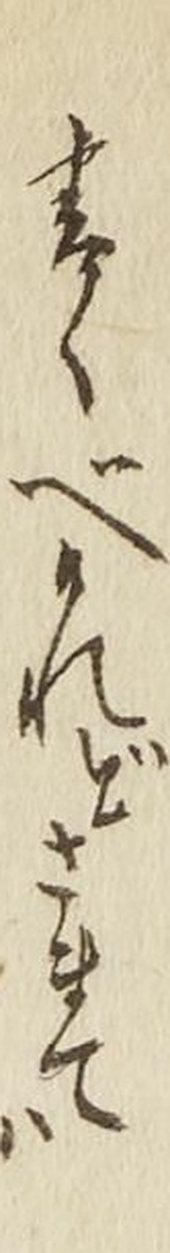書くべけれどさまては
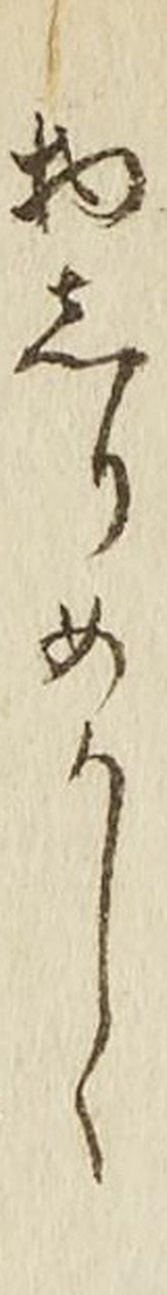物しりめかしく
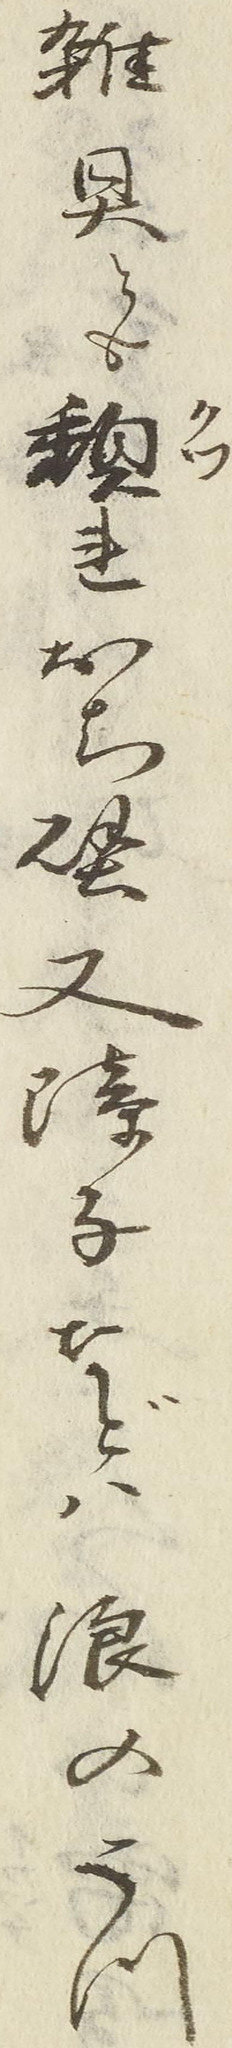雑具とも頽れおち壁又障子などは浪のうつ
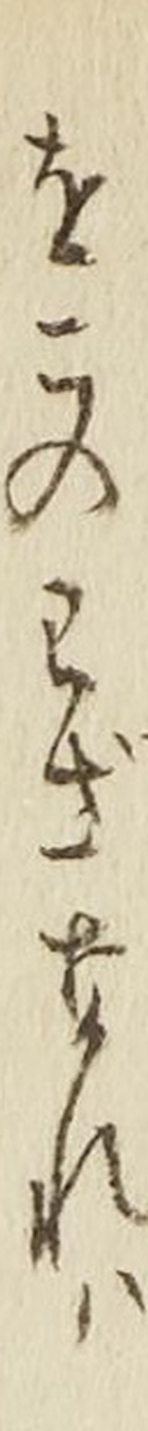をこのわざなれば
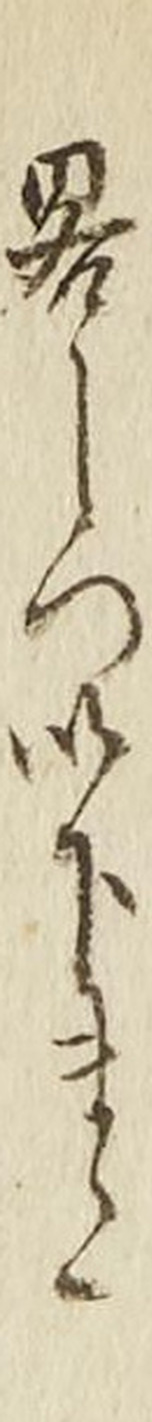略しつ以下また
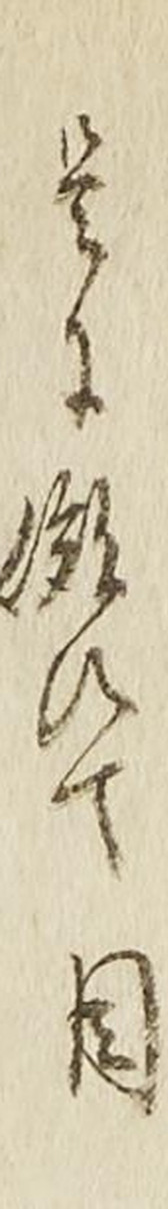是に倣ひて目
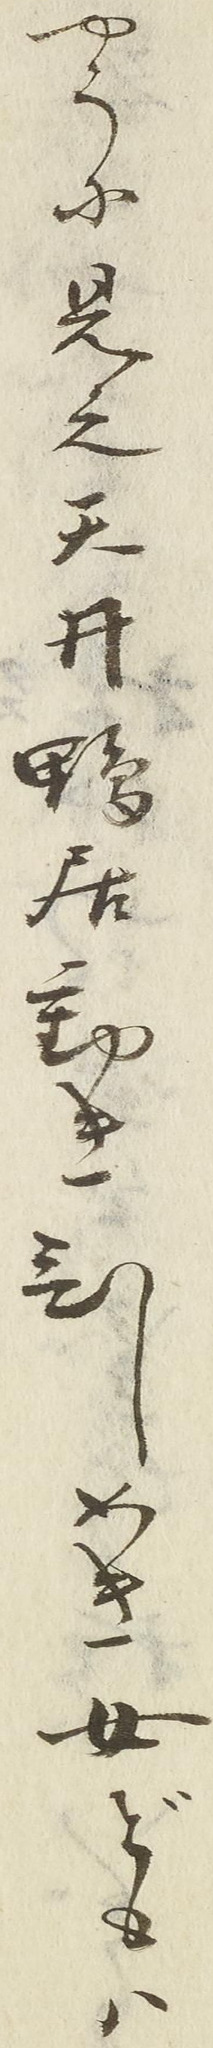やうに見え天井鴨居動きひしめき女どもは
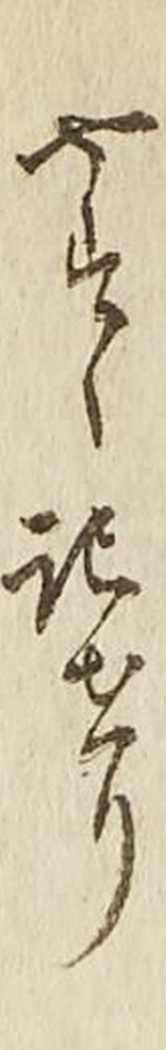やすく記せり
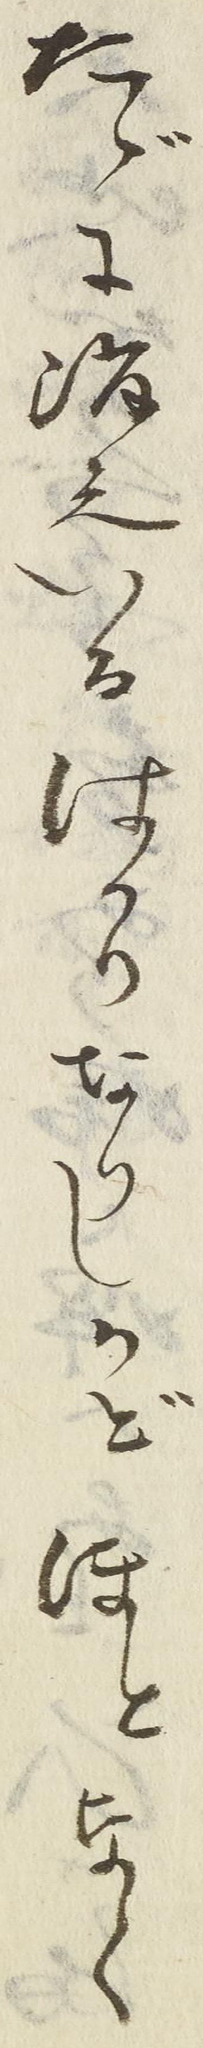たゞに消えいるはかりなりしかどほとなく
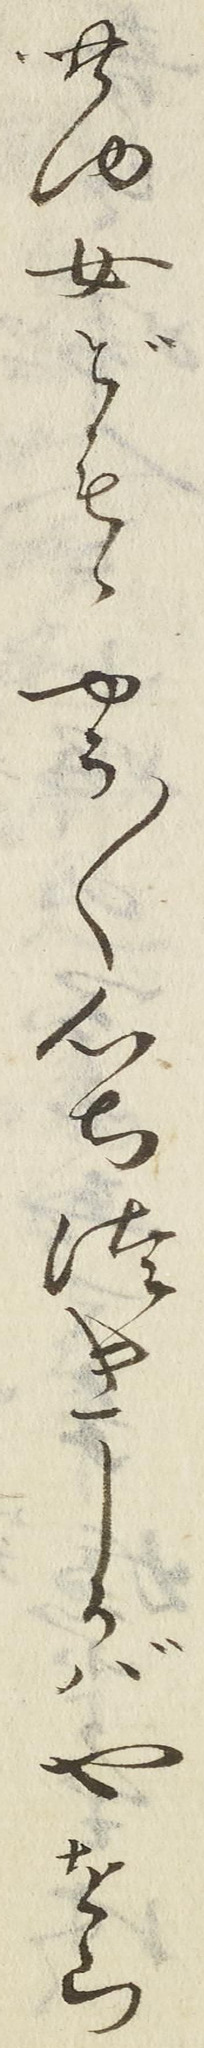聞ゆ女どもゝやう〳〵心ちつきしかばやをら
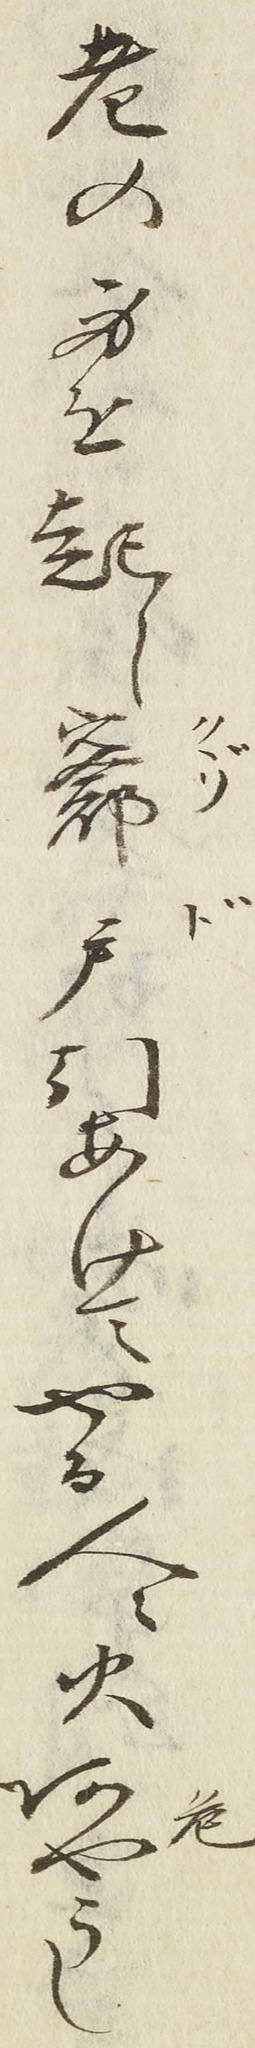老の身を起し窬戸引あけてやる人〻火あや危うし
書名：やぶれ窓の記　全
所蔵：東京大学地震研究所図書室 Earthquake Research Institute Library, The University of Tokyo, JAPAN
